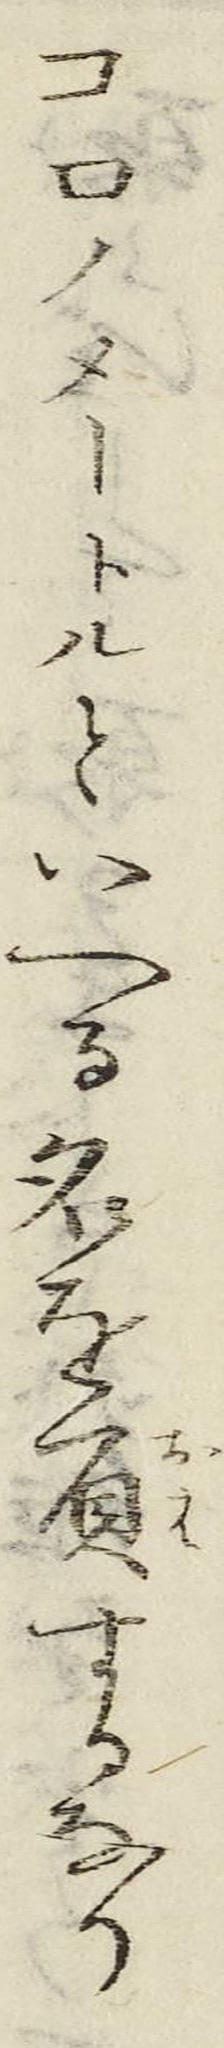コロノメートルといへる名を負するなり
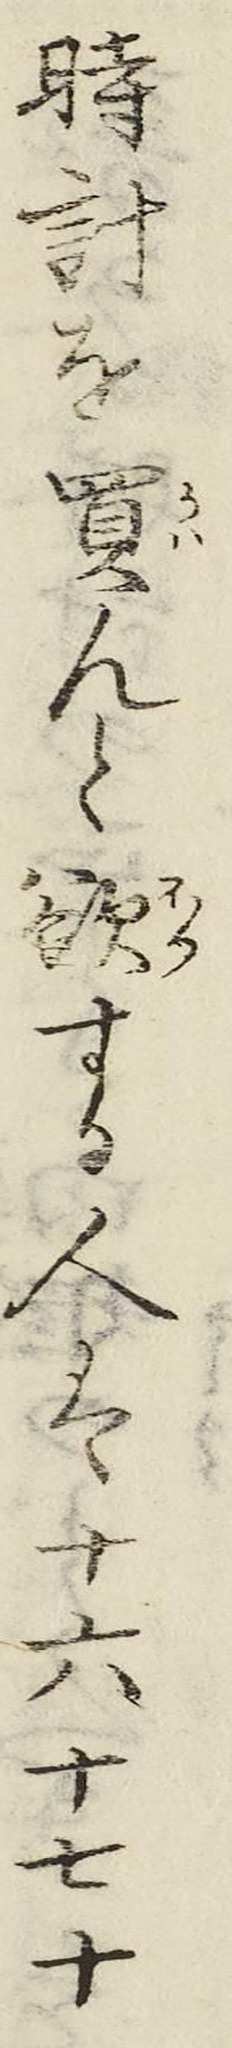時計を買んと欲する人は十六十七十
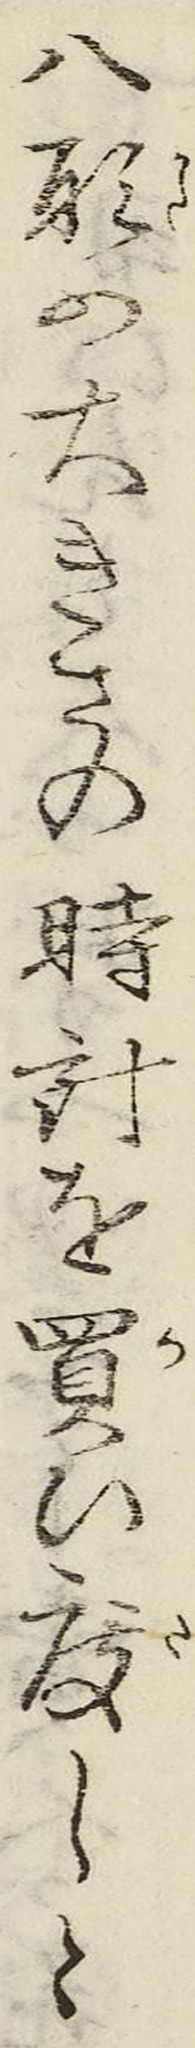八形の大きさの時計を買い度しと
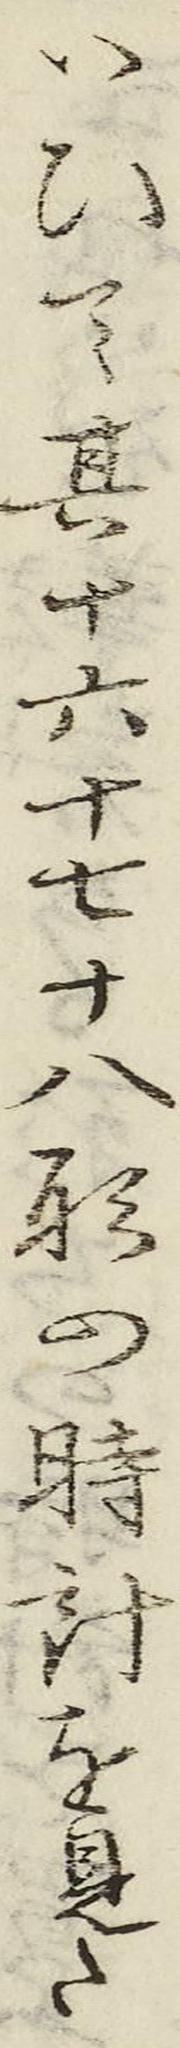いひて其十六十七十八形の時計を見た
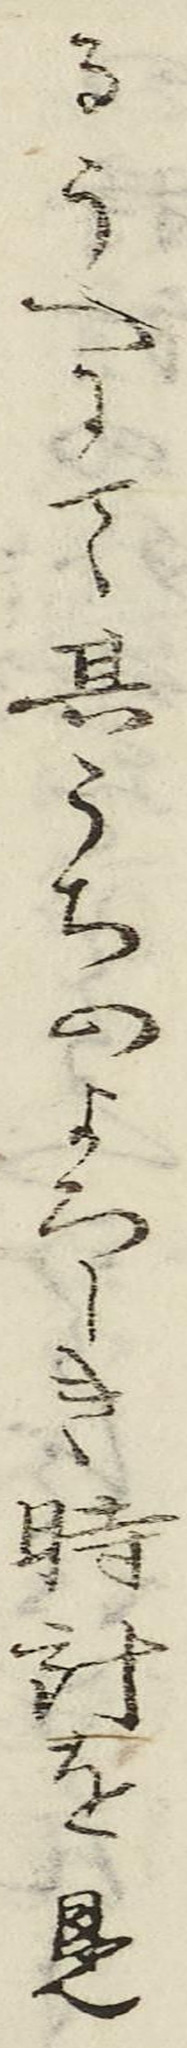るうへにて其うちのよろしき時計を見
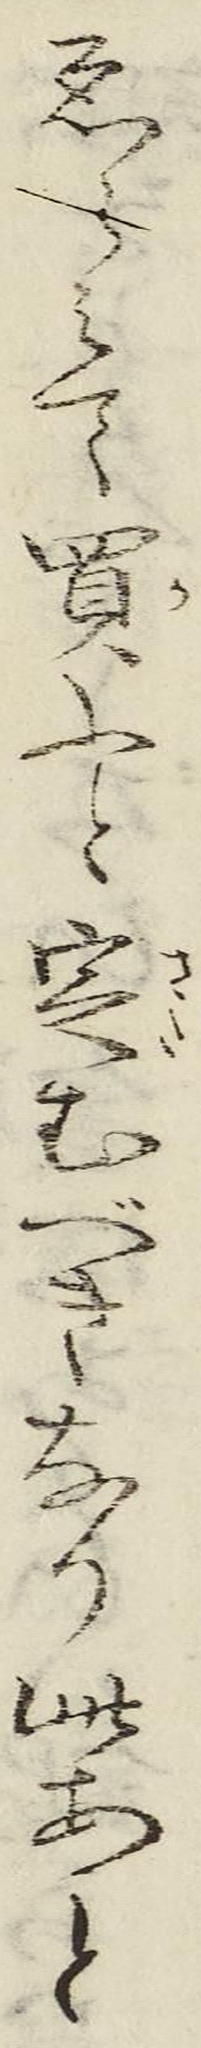ゑらみて買ふと定むべきなり此あと
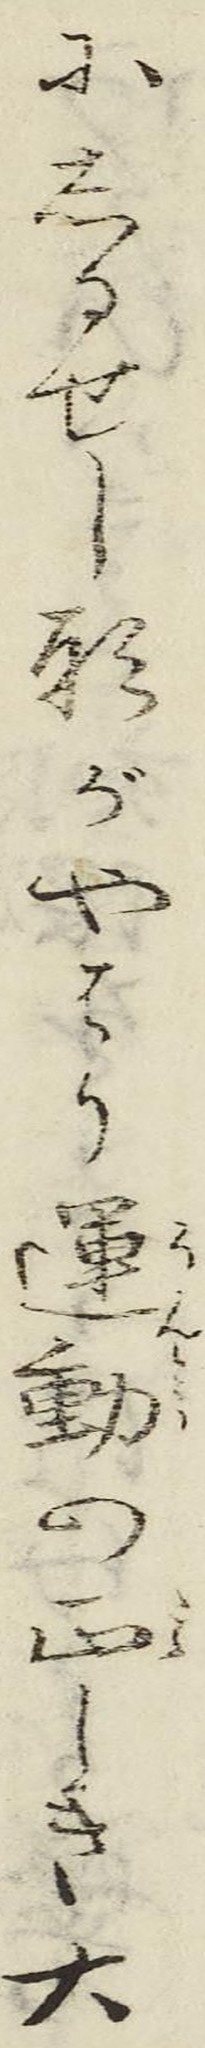にしるせし形がやはり運動の正しき大
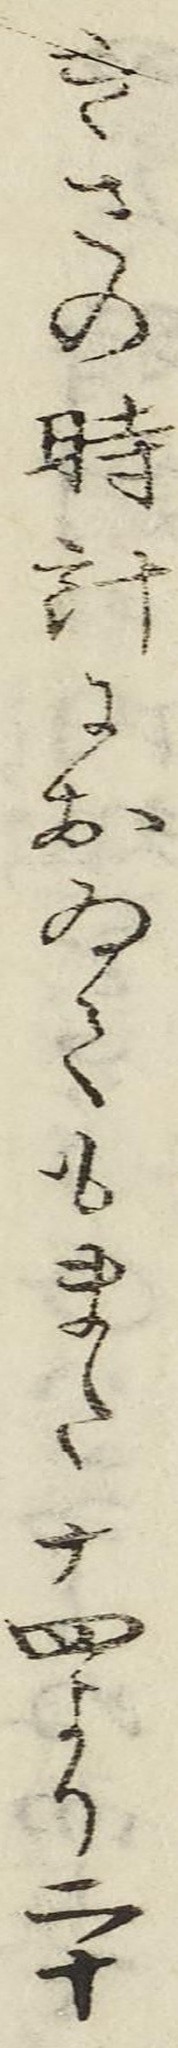きさの時計におゐてもまた十四より二十
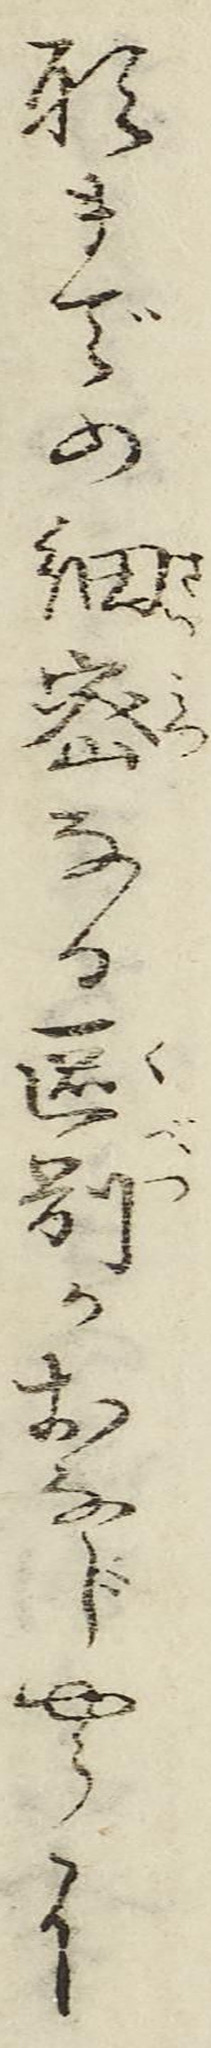形までの細密なる区別かおなじやうに

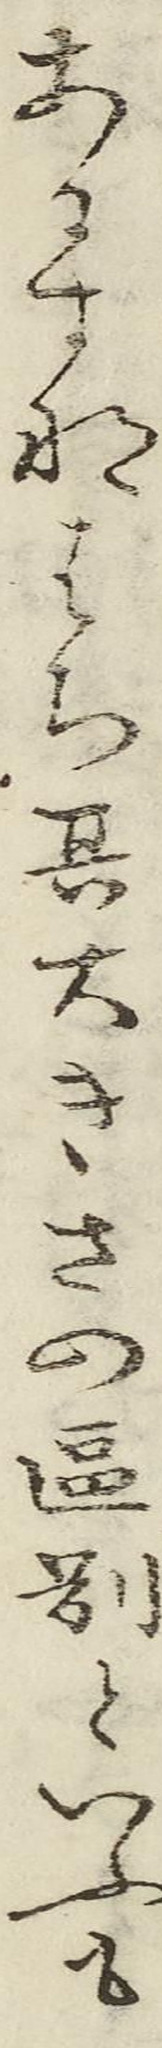あるすなはち其大きさの区別といふも
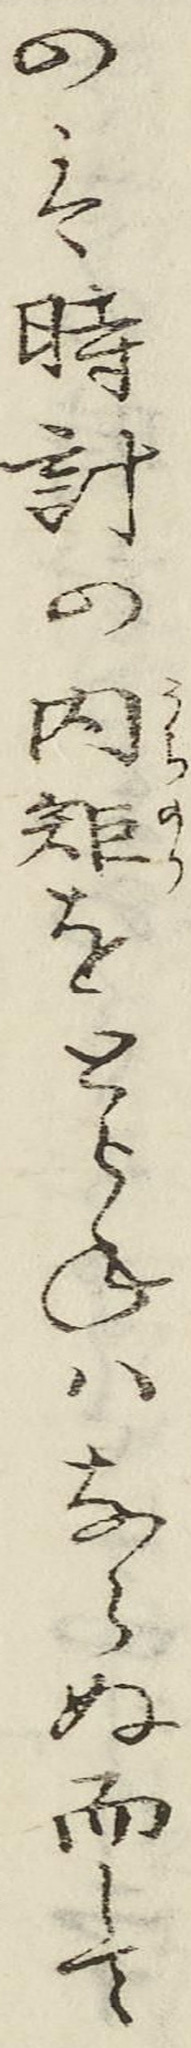のは時計の内矩をとらねはならぬ而して
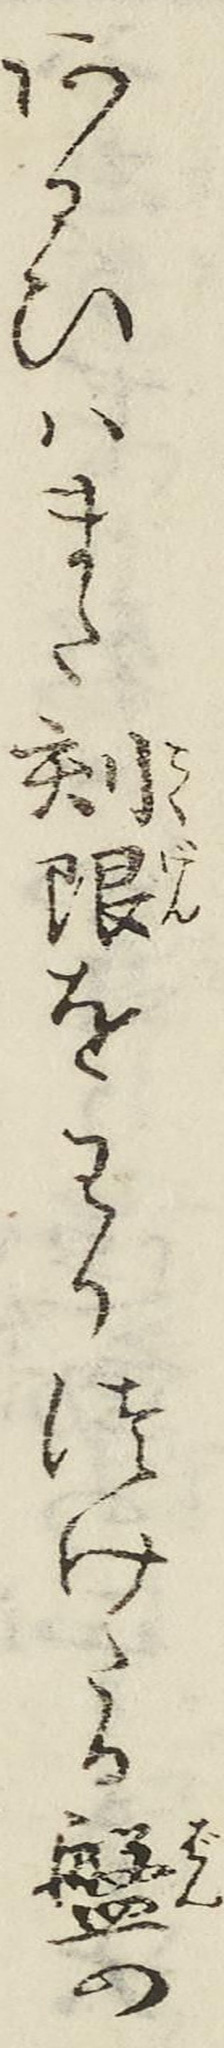あるひはまた刻限をわりつけたる盤の
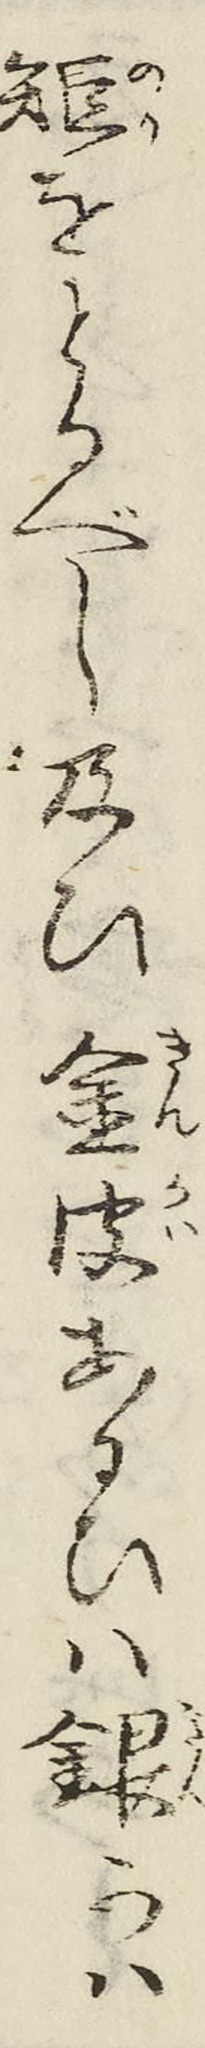矩をとるべし及ひ金皮あるひは銀かは
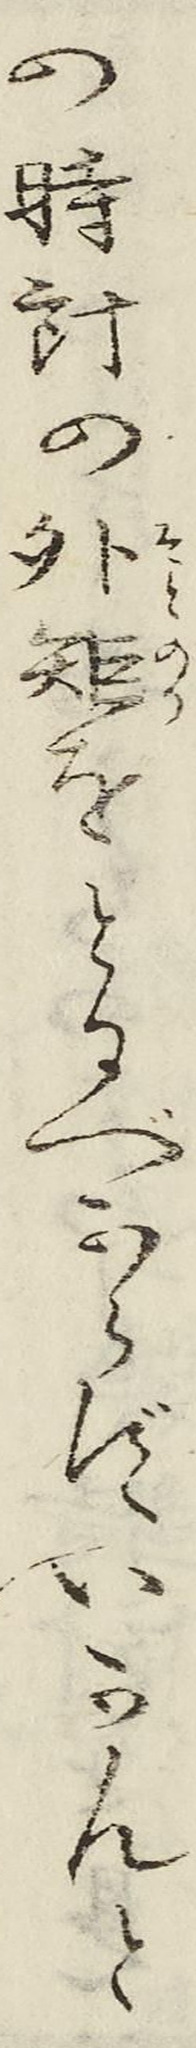の時計の外矩をとるべからずいかんと
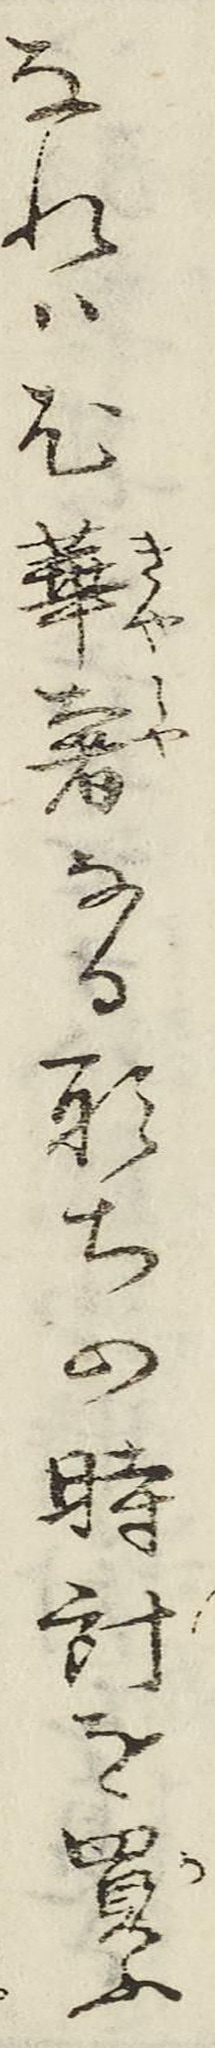なれは尤華奢なる形ちの時計を買ふ
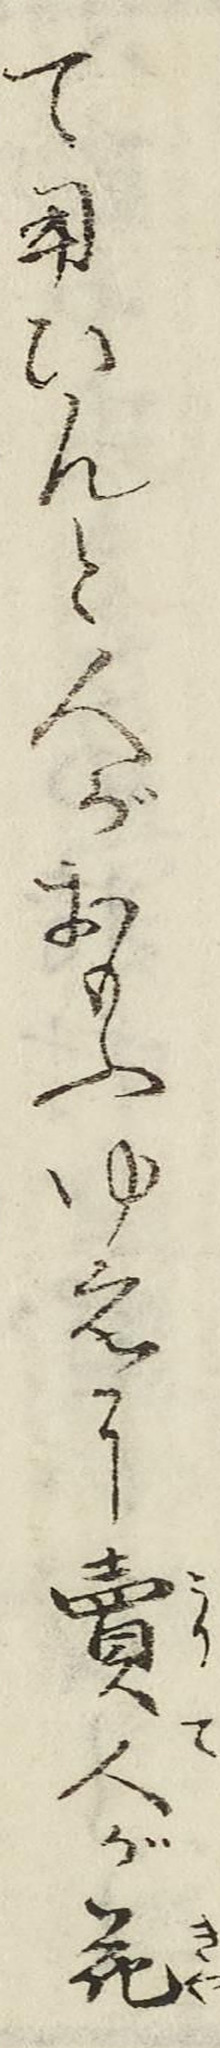て用ひんと人がおもふゆえに売人が花
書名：[時計に関する冊子]
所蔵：東京大学地震研究所図書室 Earthquake Research Institute Library, The University of Tokyo, JAPAN
